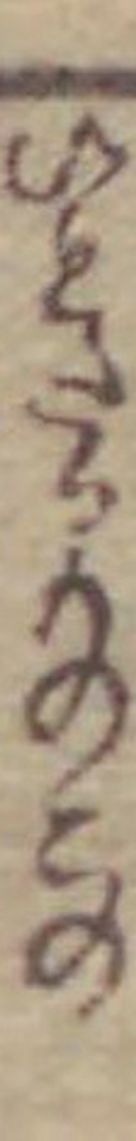ひとたるものこの
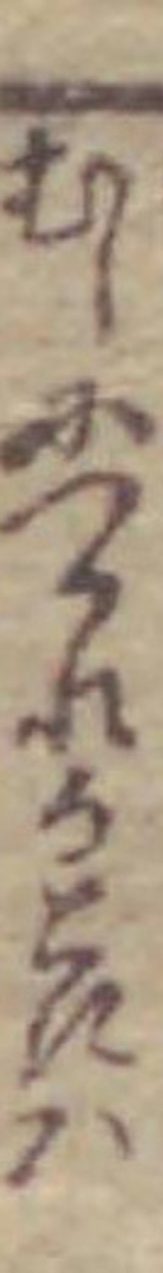むしにつかれるときは
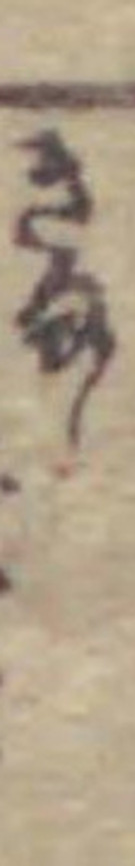きまゝ
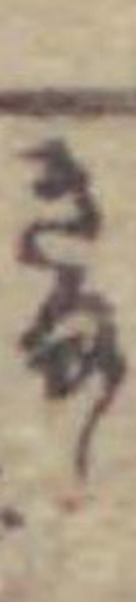きまゝ
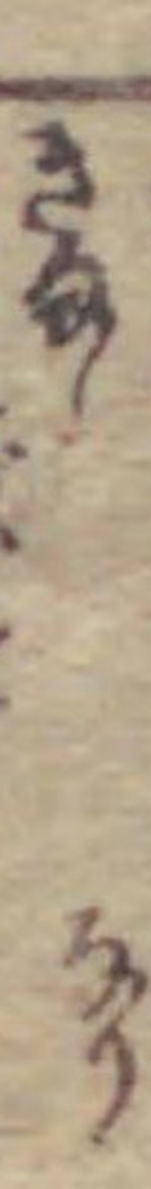きまゝ
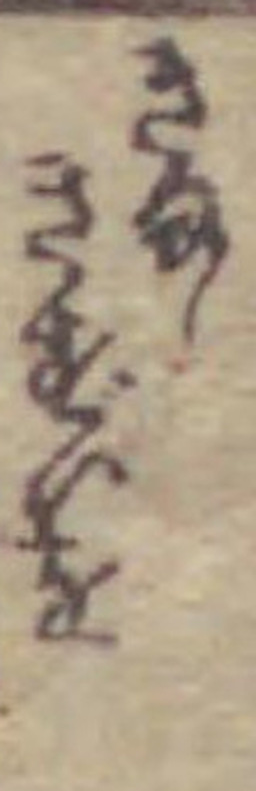きすいを
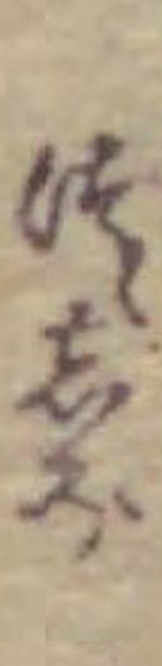つゝしみ
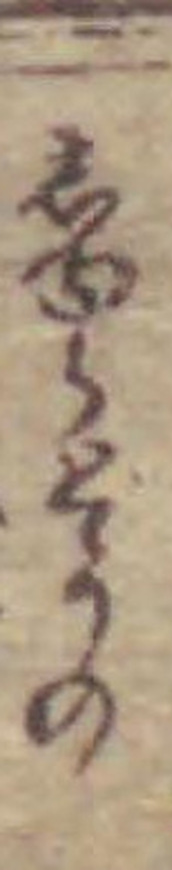しゆらどうの
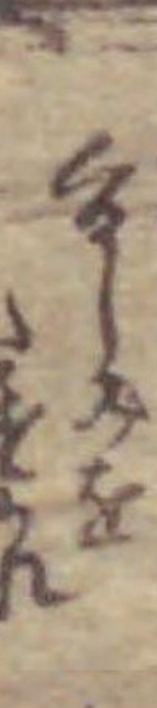くるしみを
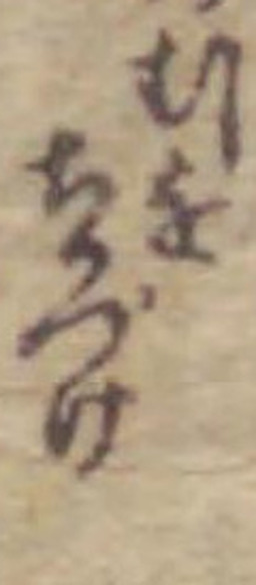ちかづけ
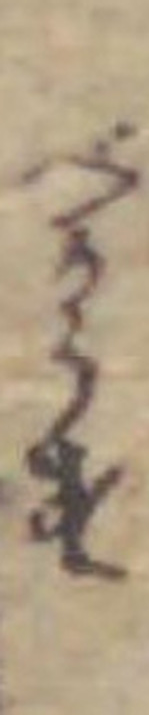べからす
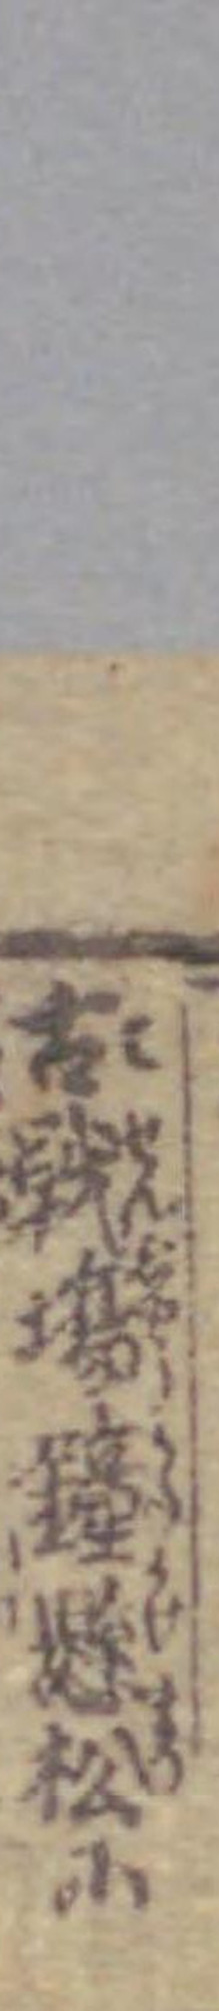古戦場鐘懸松に
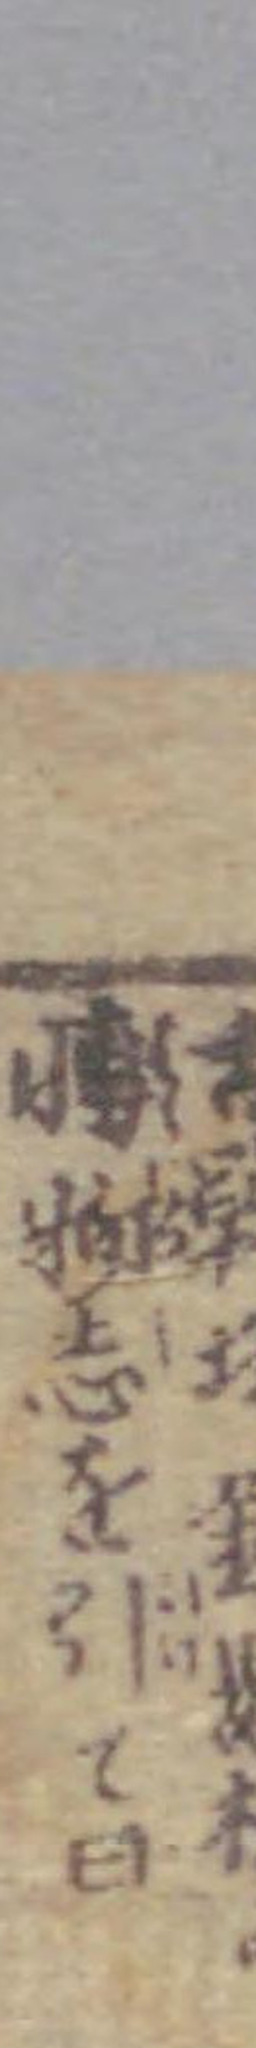博物志を引て曰
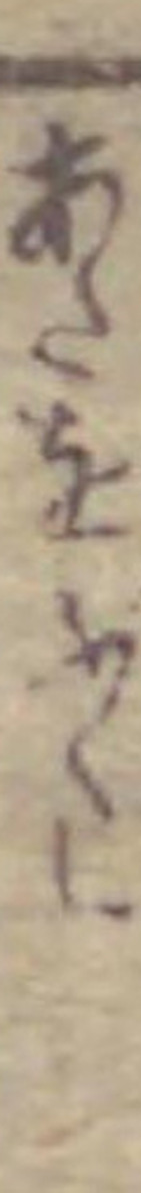あたをぶくし
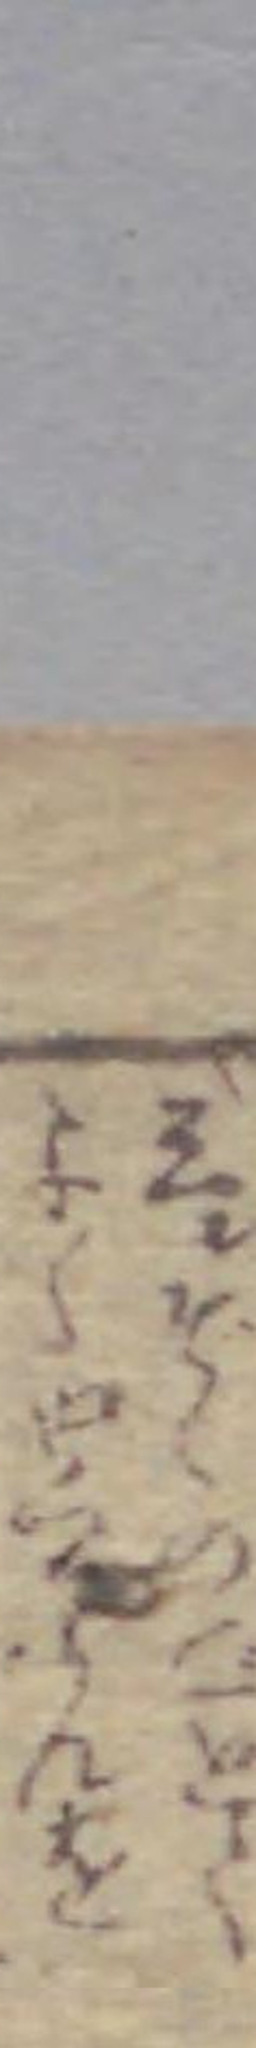よくやくわんを
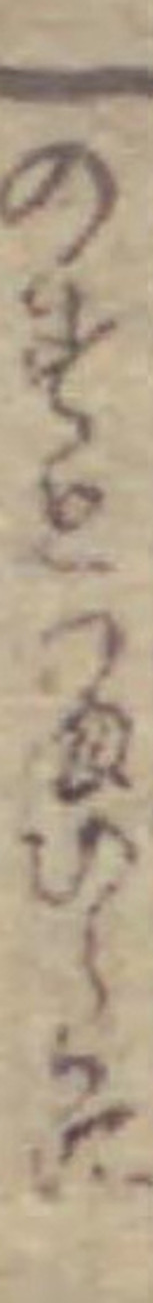のすとつまびらかに
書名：化物和本草 : 3巻
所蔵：国立国会図書館 National Diet Library, JAPAN
